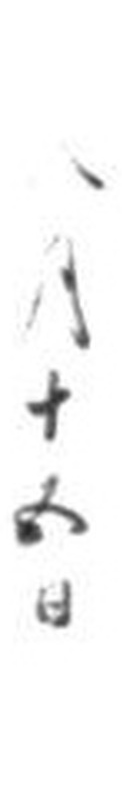八月十五日
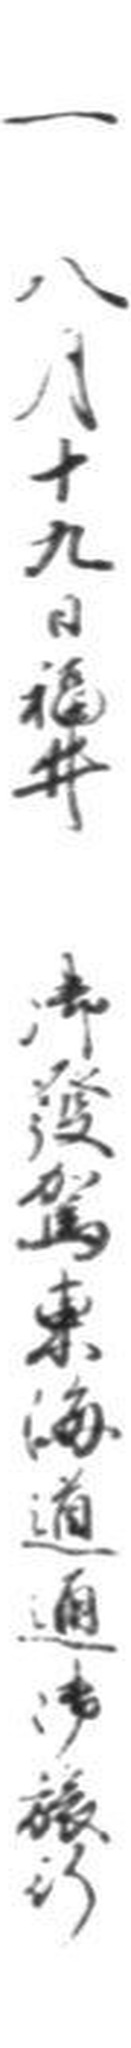一八月十九日福井御発駕東海道通御旅行
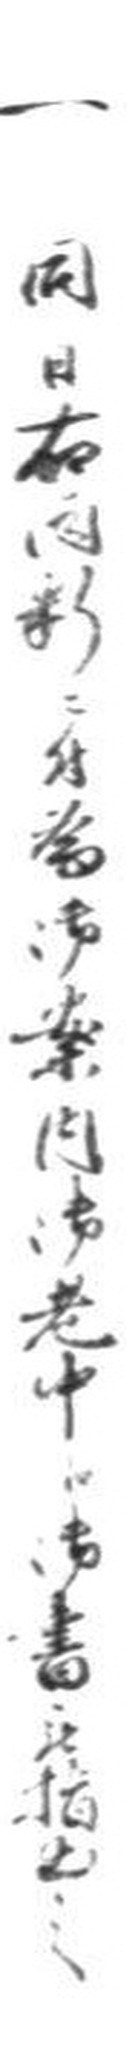一同日右同断ニ付為御案内御老中江御書被指出之
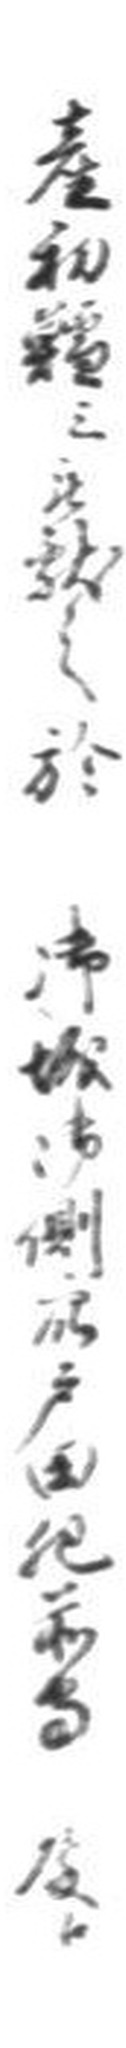産初鱈三被献之於御城御側衆戸田肥前守殿江
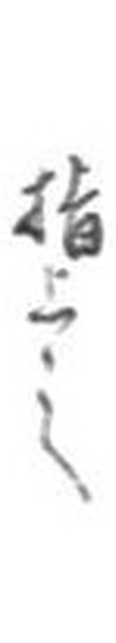指出之
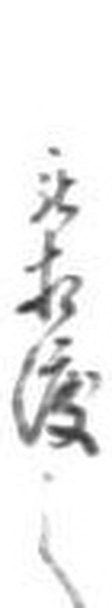被相渡之
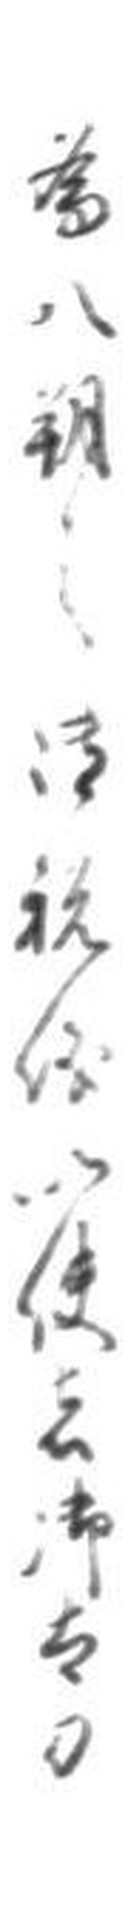為八朔之御祝儀以使者御太刀
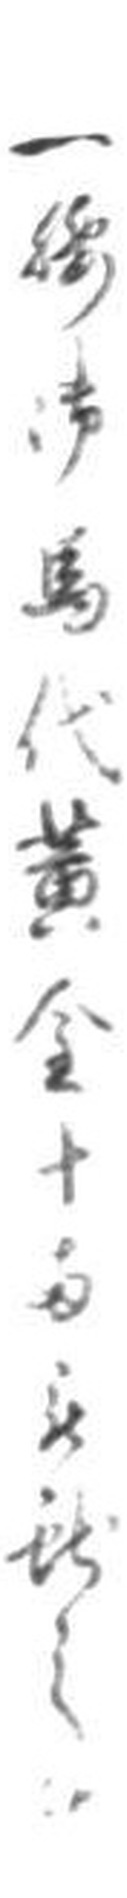一腰御馬代黄金十両被献之候
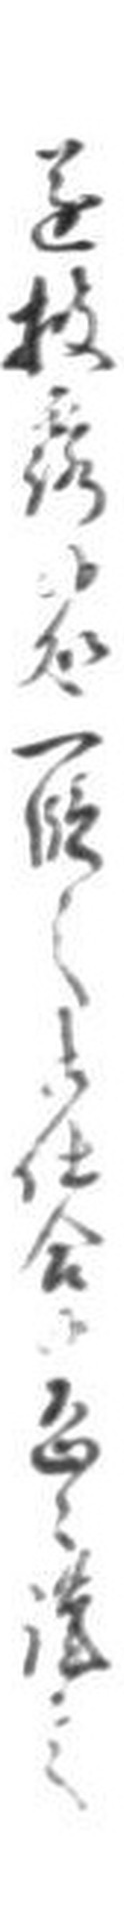遂披露候処一段之御仕合候恐々謹言
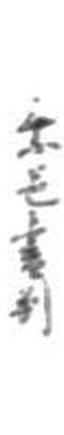乗邑書判

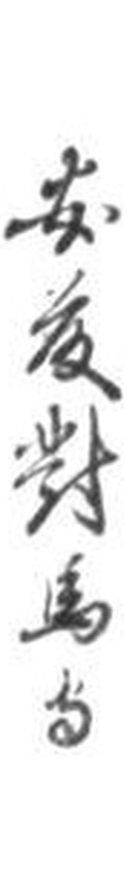安藤対馬守
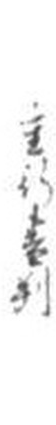重行書判
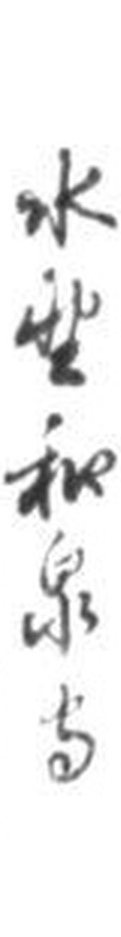水野和泉守
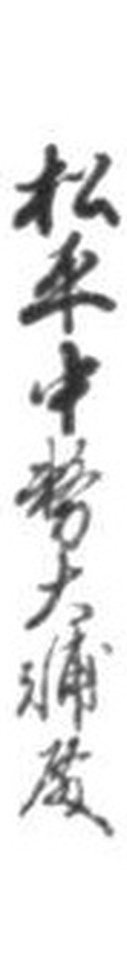松平中務大輔殿
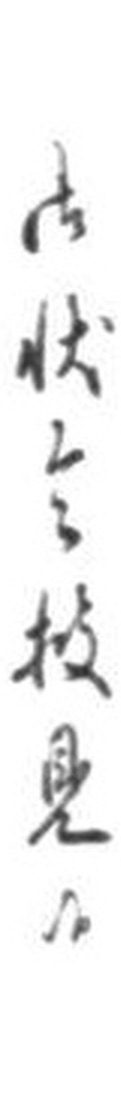御状令披見候
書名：家譜 三十六 宗昌公 従享保八年到同九年
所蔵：福井県文書館 Fukui Prefectural Archives
